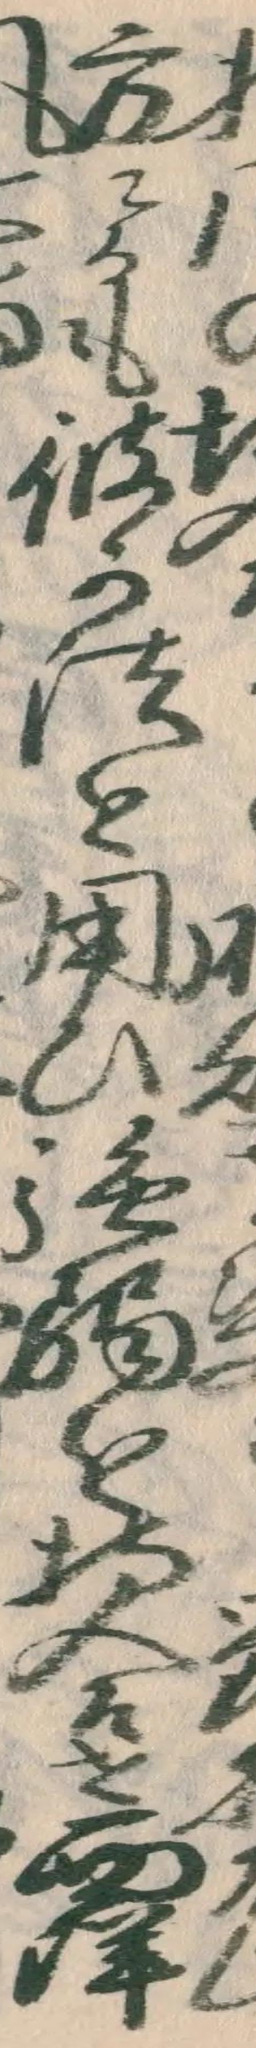方ニ而も彼か法を用ひ強弱を持合せ西洋
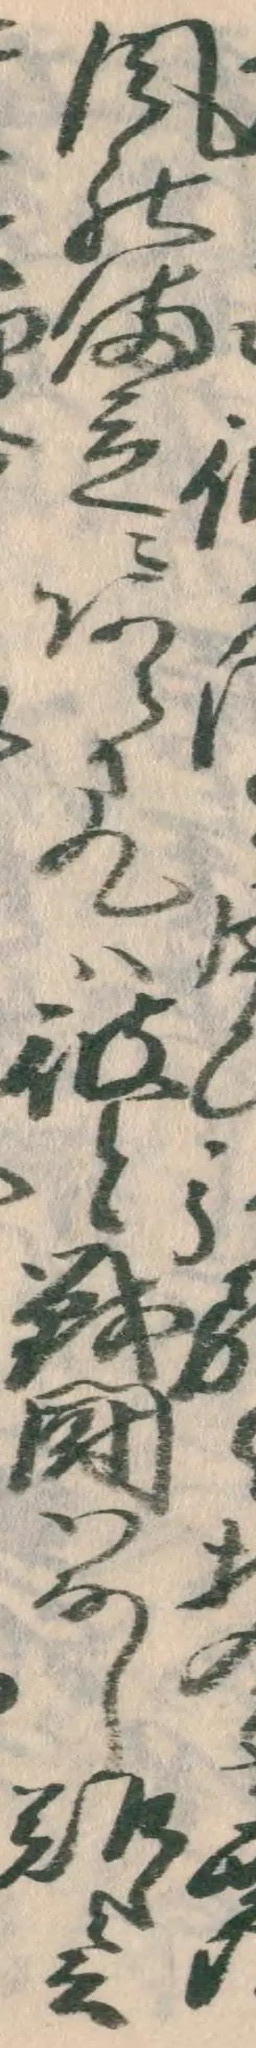風の備立ニあらされハ彼と戦闘ハなし難しと云
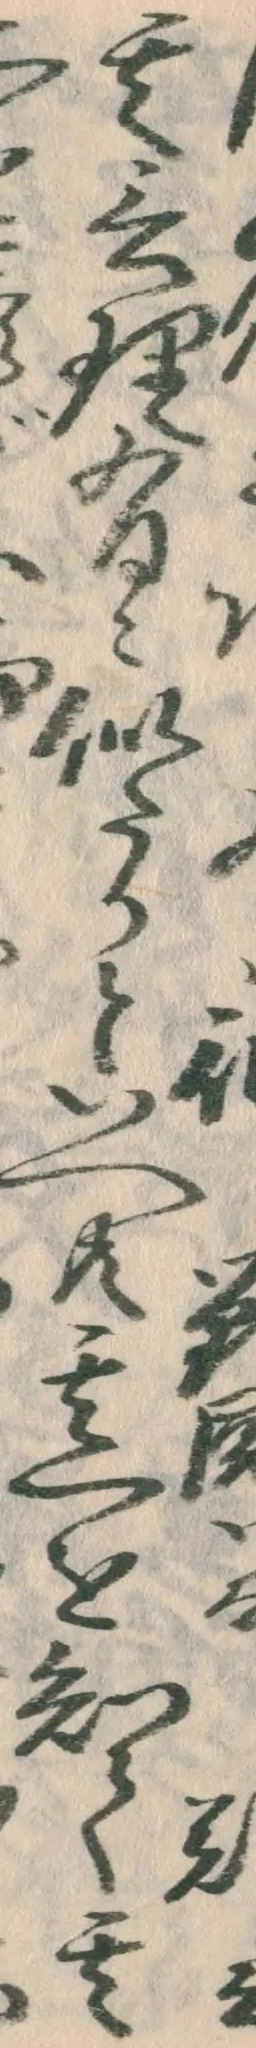其言理有ニ似たりといへ共其一を知て其
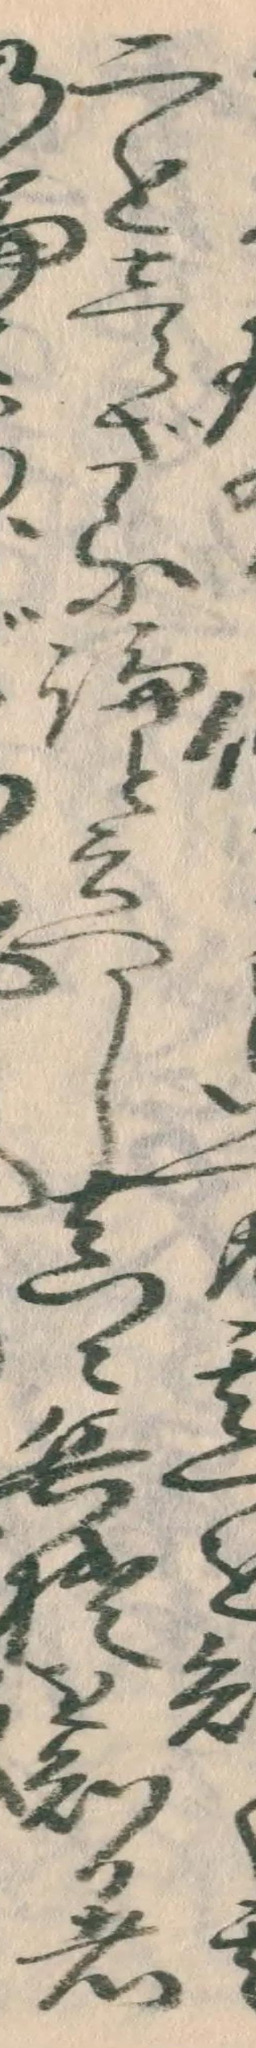二をしらざる論と云へし真ニ兵機を知る者
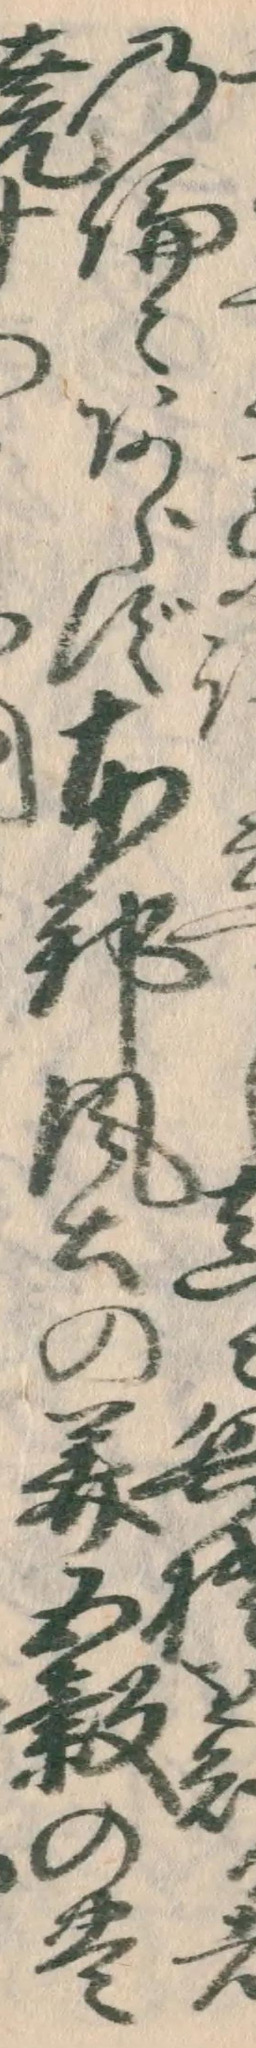の論ニあらず本邦風土の美五穀の豊
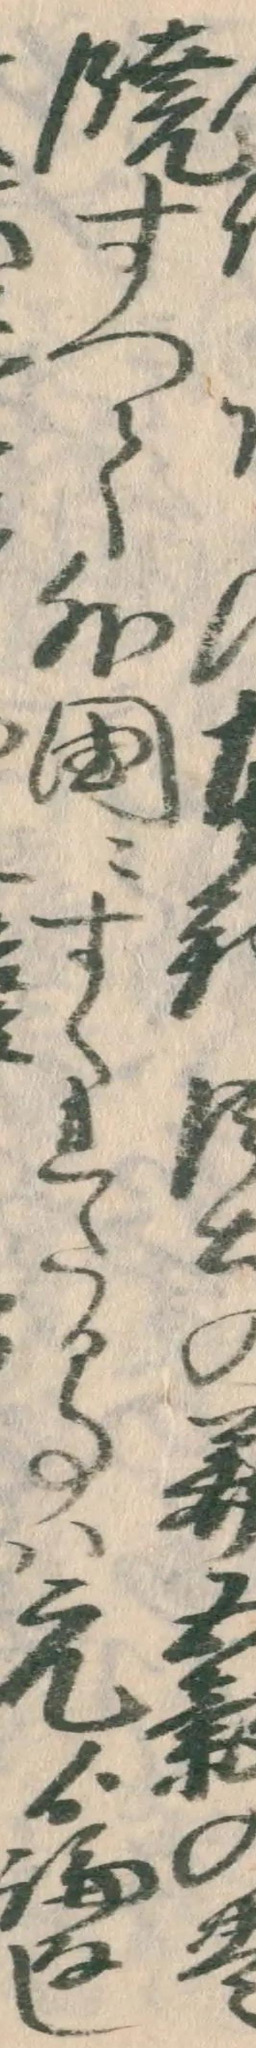穣すへて外国ニすくれたる事ハ元より論なし
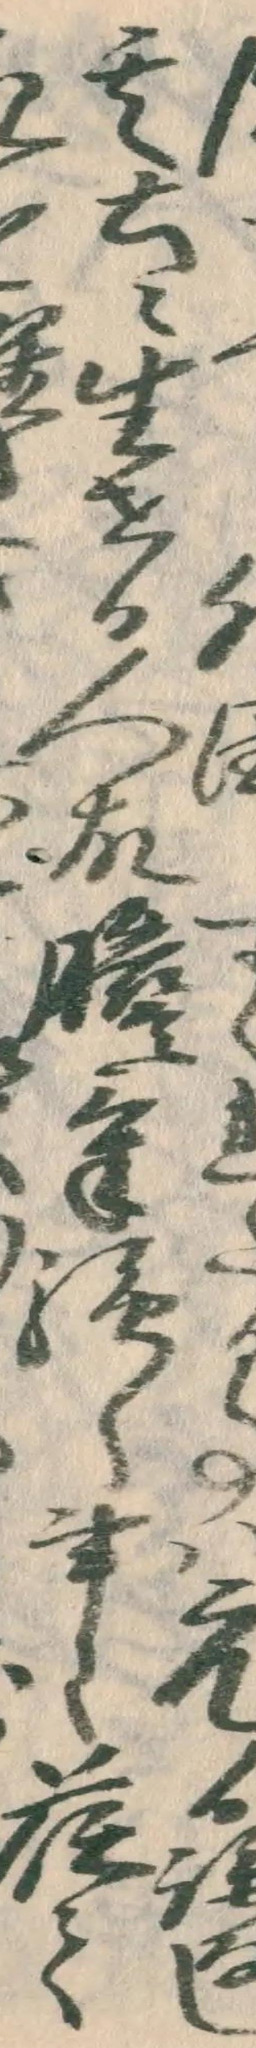其土に生ける人故膽氣強く事に莅て
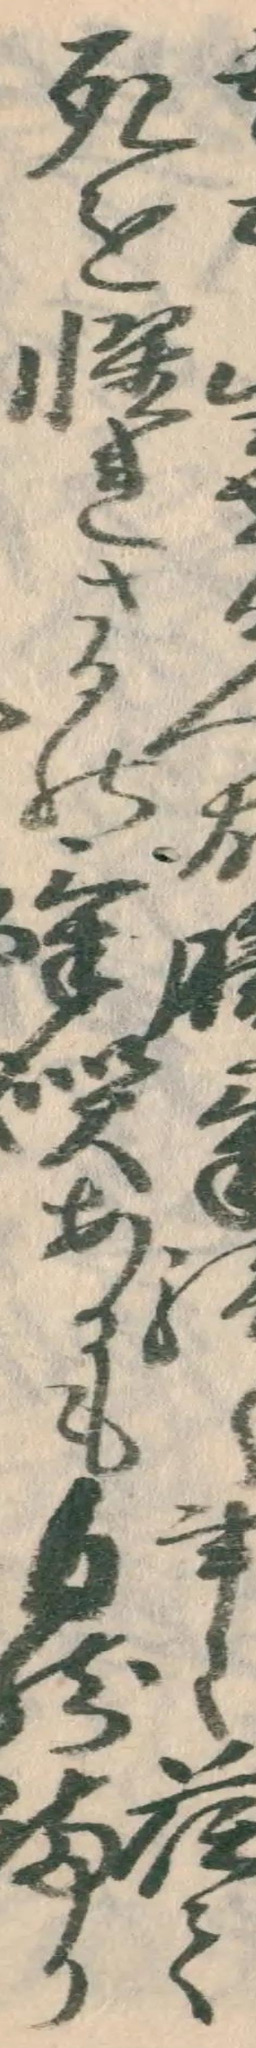死を懼れさるの気質あるも自然備り
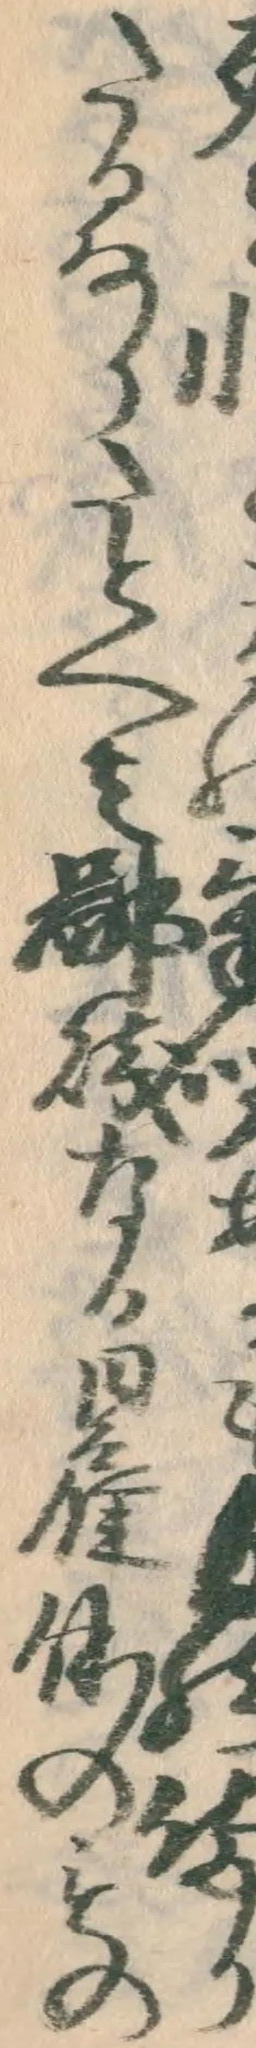たるなりたとへは鄙賤なる日雇体のもの

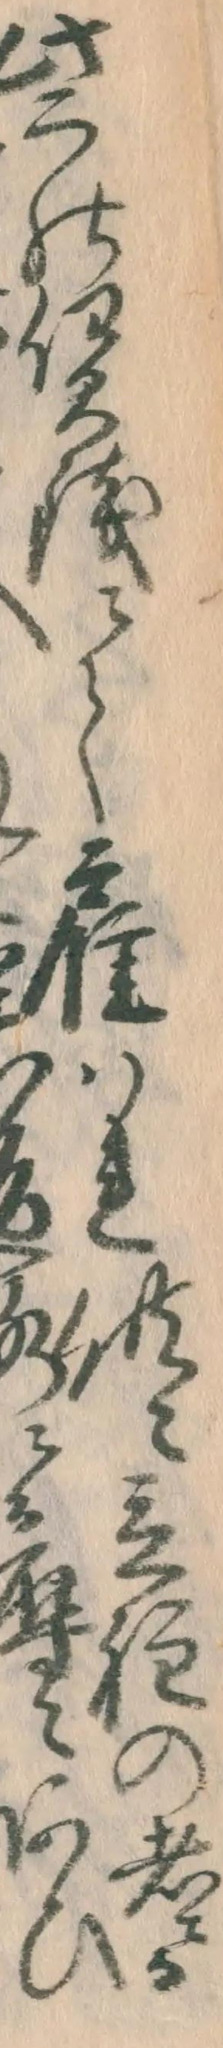些の賃銭ニて雇ハれ供ニ立程の者ニ而
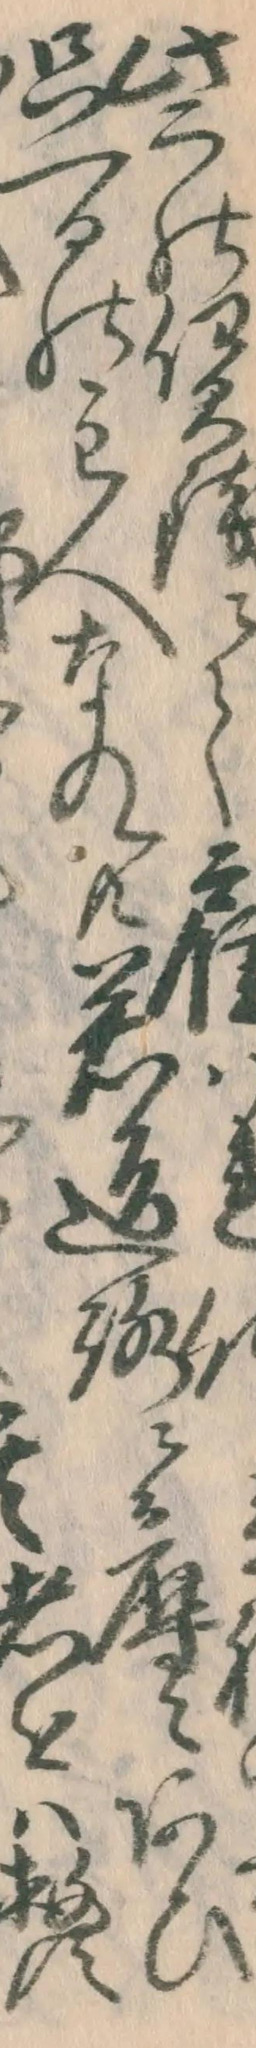只一日の主人なれ共若道路二而辱ニあひ
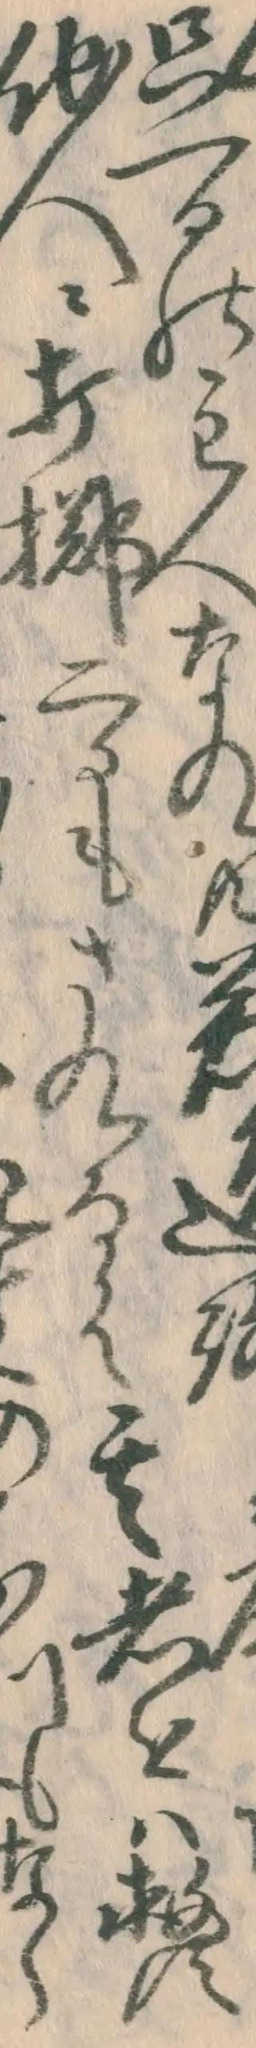他人ニ打擲事もされなは其者をハ赦す
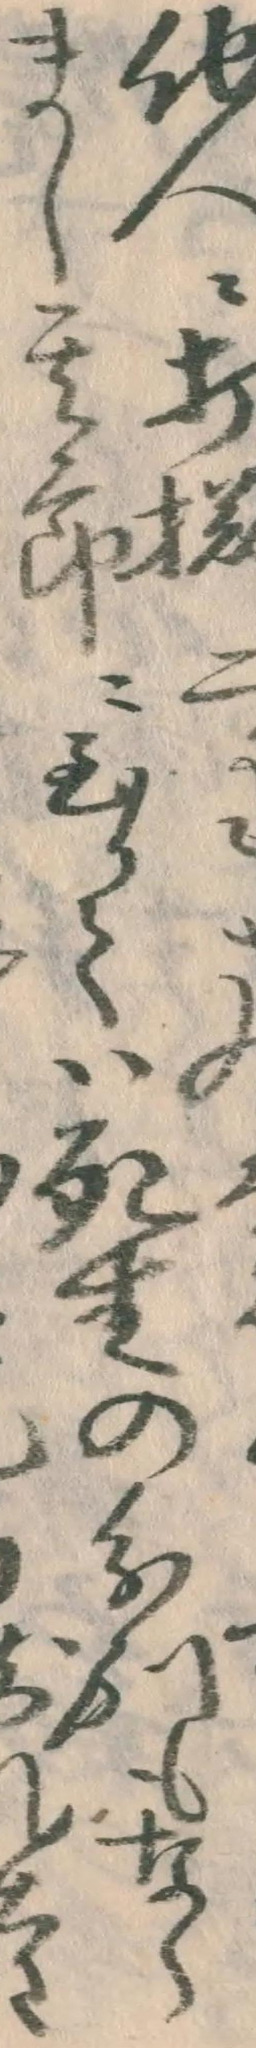まし其節ニ至りてハ死生の分別もなく
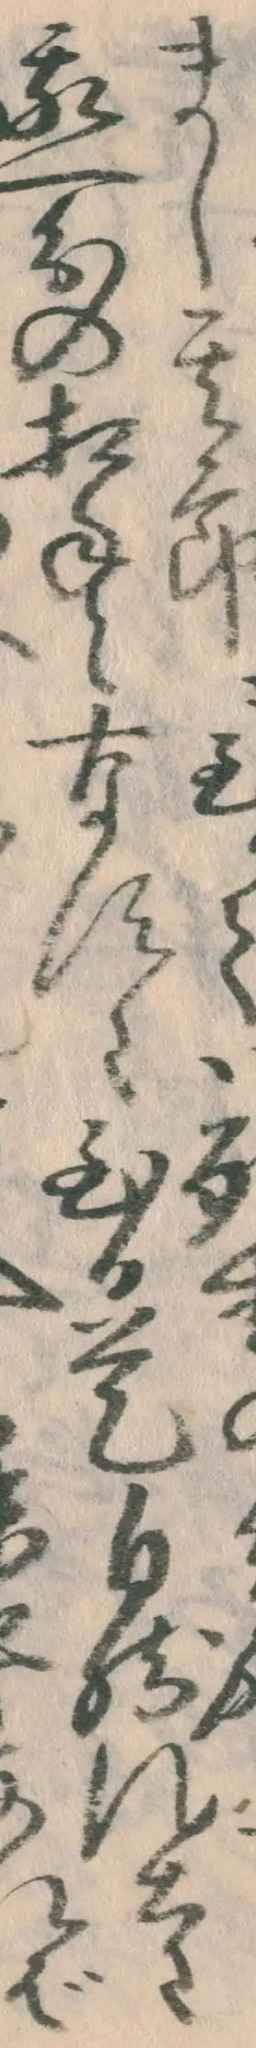我一分の相手となすニ至る是自然風土に
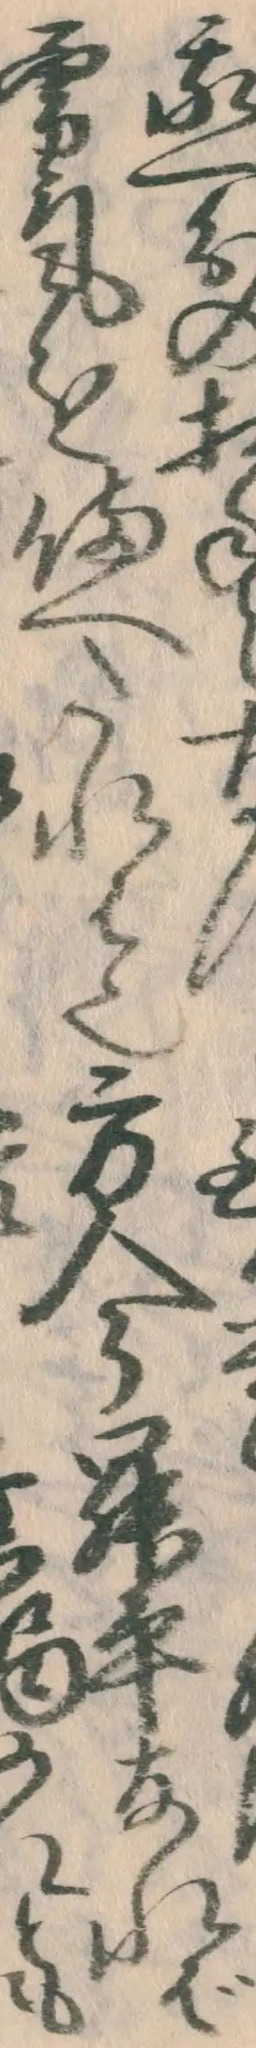勇気を備へたれは也方今曻平なれば
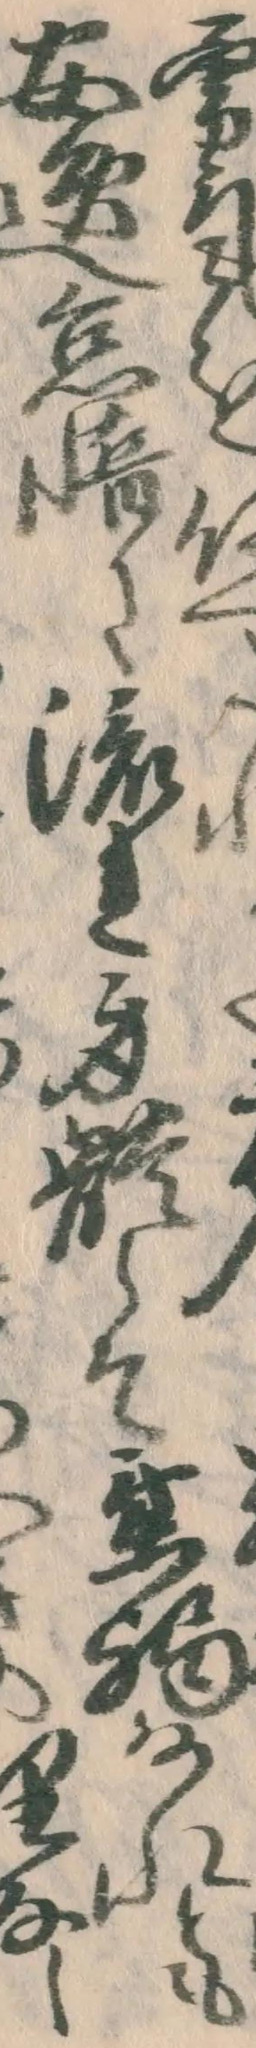安逸怠惰に流れ身體して柔弱なれとも
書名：麗斎叢書. 20
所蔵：国立国会図書館 National Diet Library, JAPAN
